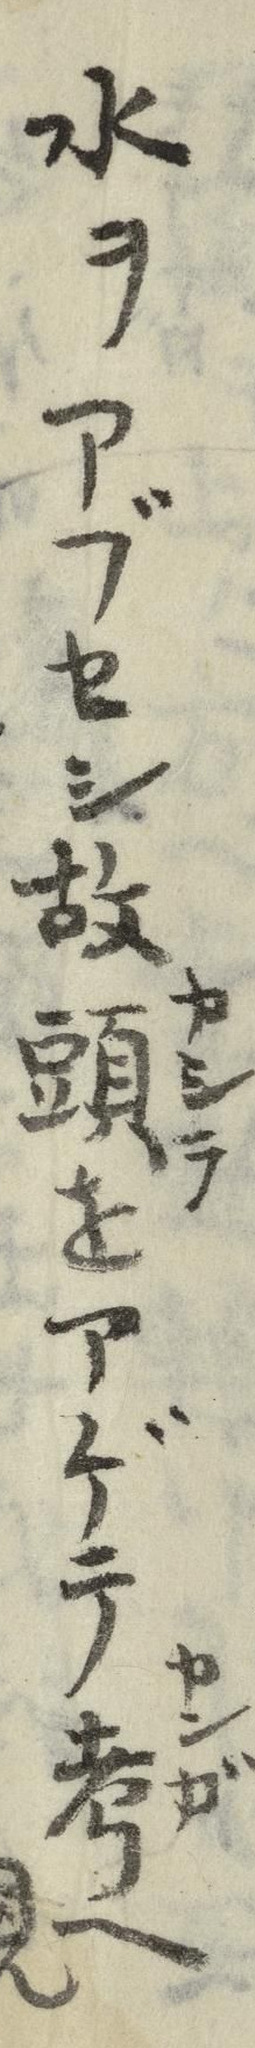水ヲアブセシ故頭をアゲテ考へ見
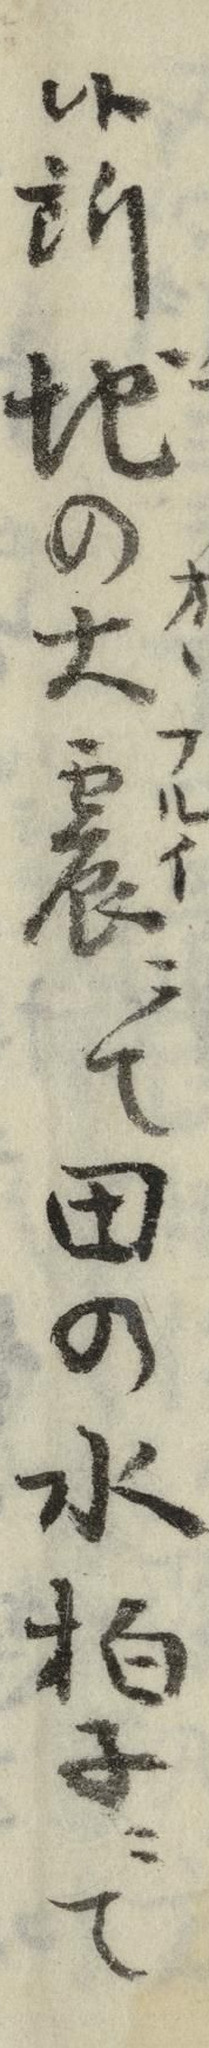候所地の大震二て田の水拍子二て
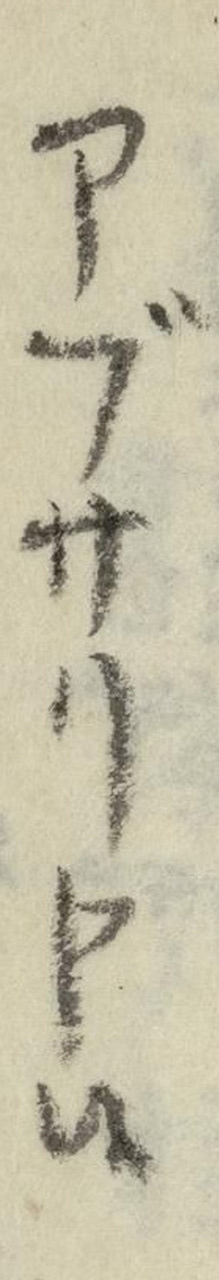アブサリ申候
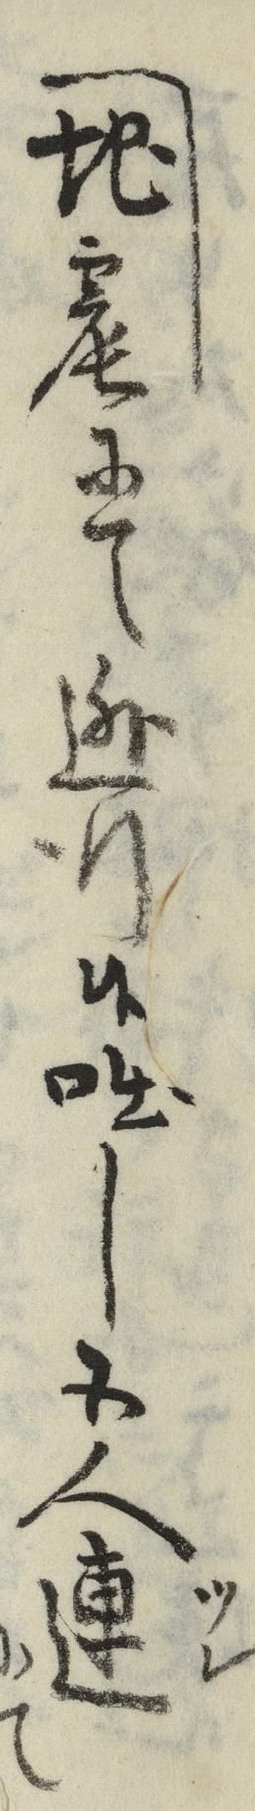地震にて逃行候咄し五人連にて
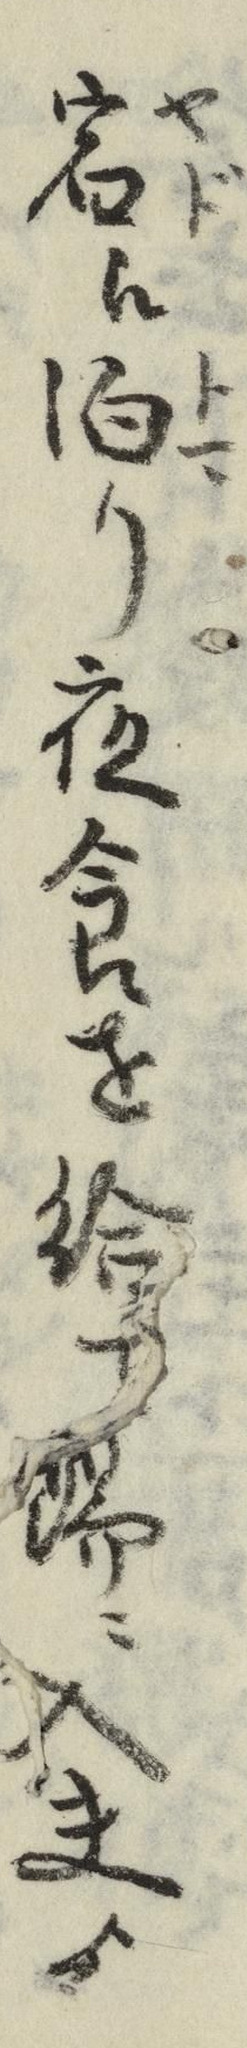宿え泊り夜食を給て湯二入夫ゟ
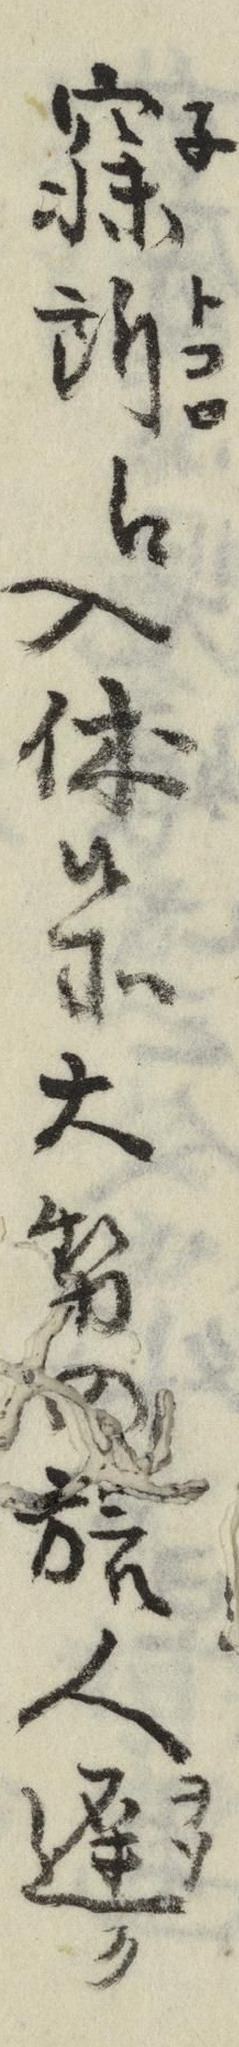寝所え入休候所大勢の旅人遅ク
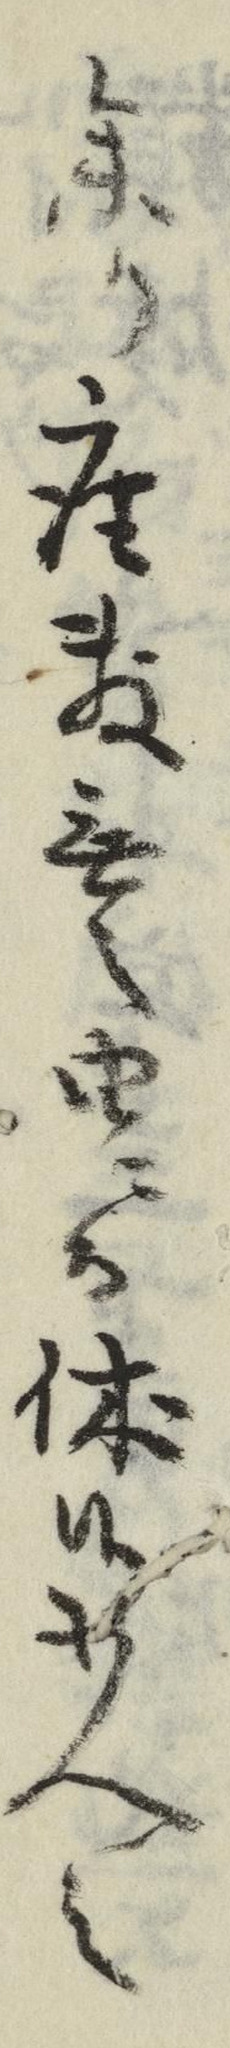参り座敷無之由二而休候五人之
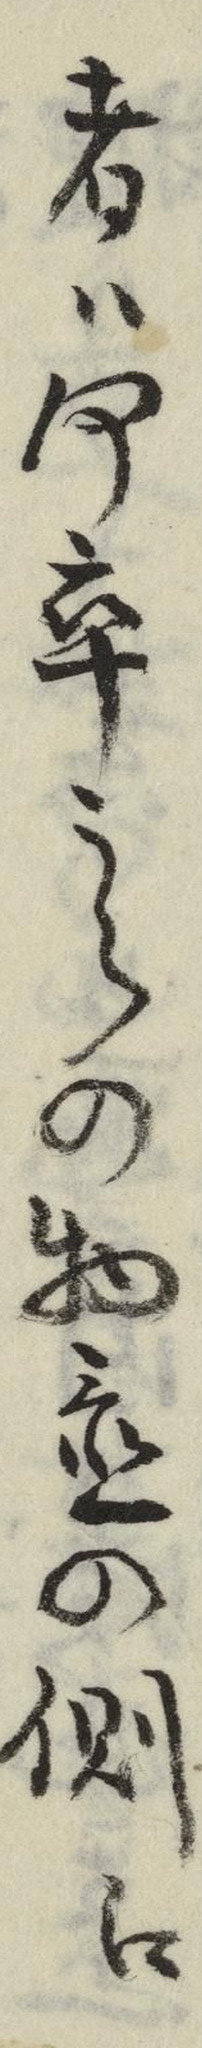者ハ何卒うらの物置の側え
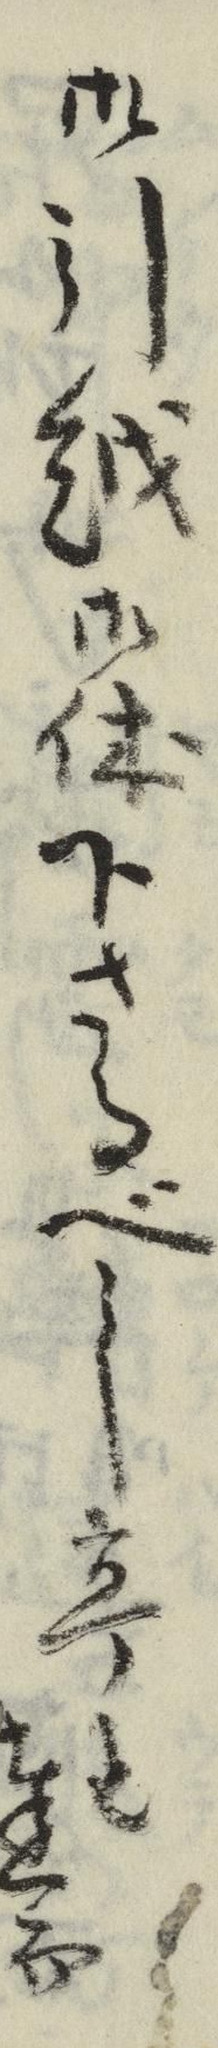御引越御休下さるべし亭主達而
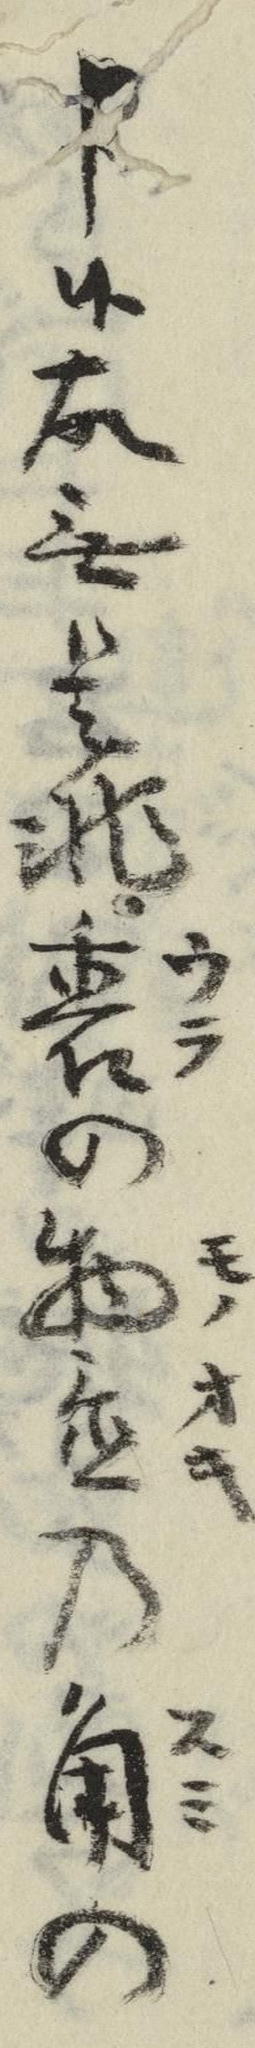申候故無是非裏の物置乃角の
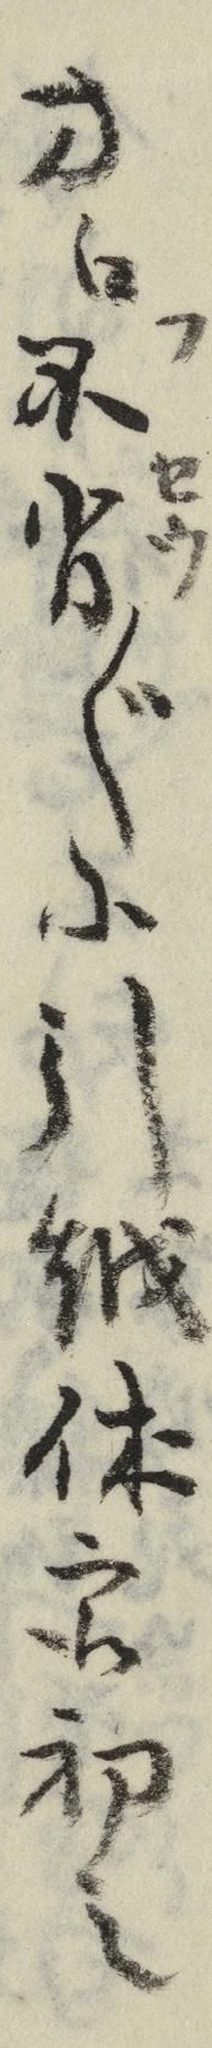方え不肖〴〵に引越休最初之
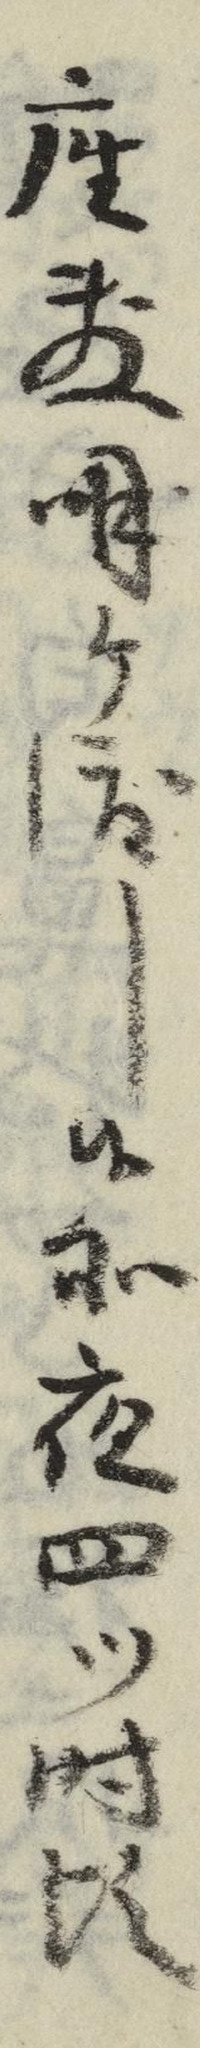座敷明ヶ渡し候所夜四ツ時頃
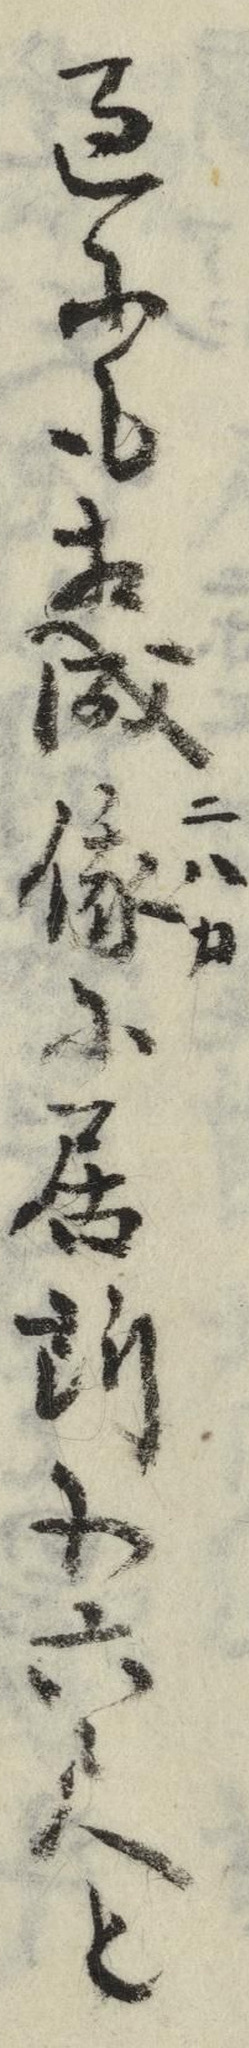過にも相成俄に居所五六尺と

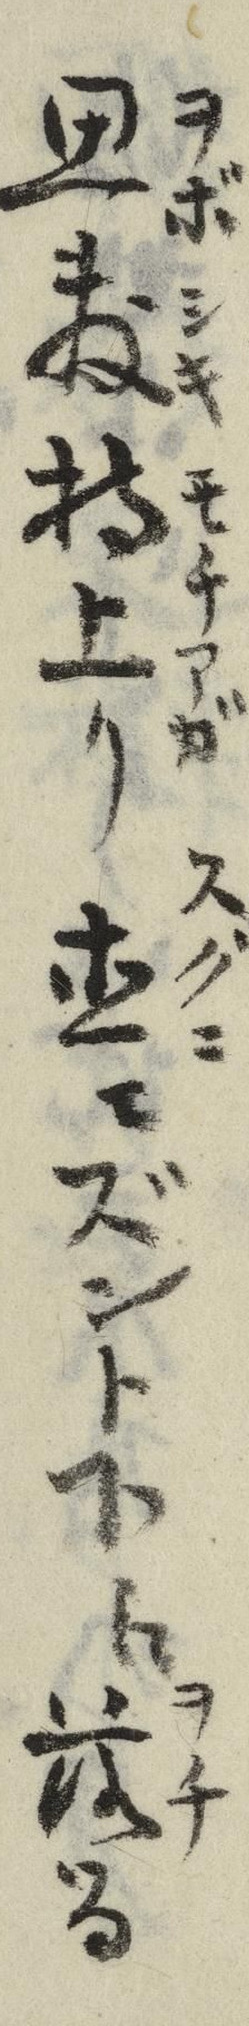思敷持上り直二ズンド下え落る
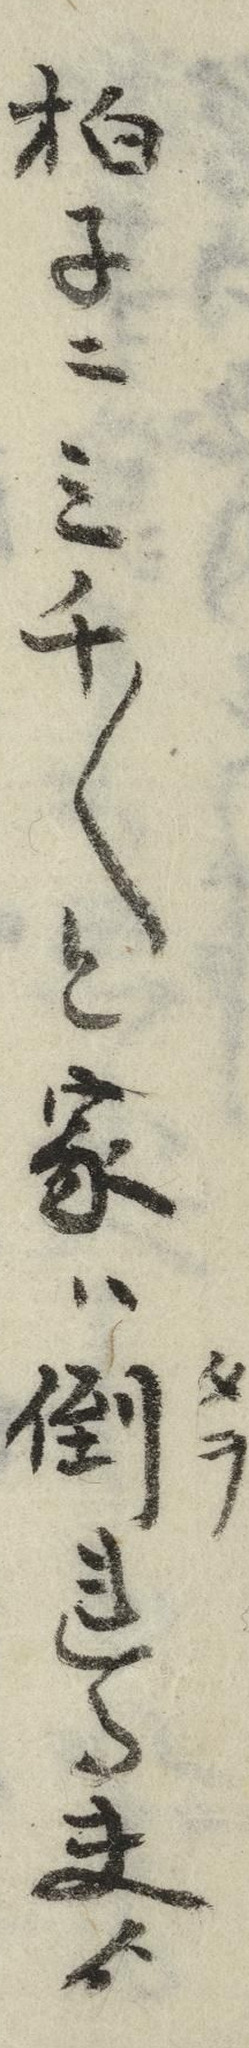拍子二ミチ〳〵と家ハ倒れる夫ゟ
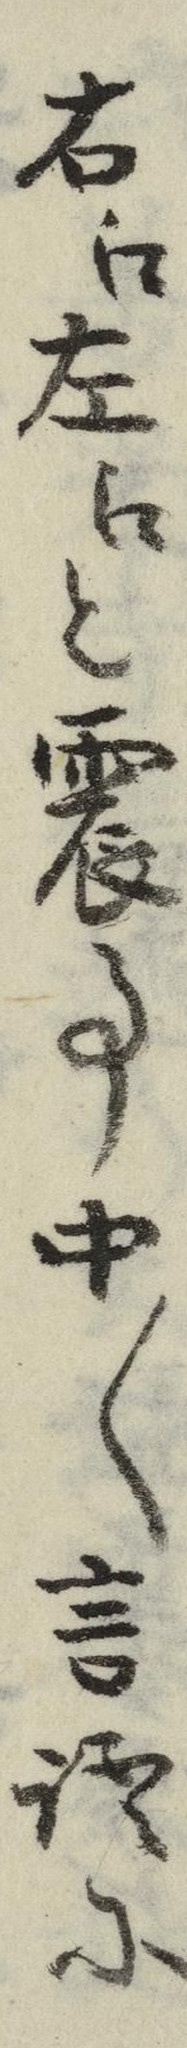右え左えと震事中〳〵言語に
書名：信州大地震一件之冩　丁未弘化四年三月吉日
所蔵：東京大学地震研究所図書室 Earthquake Research Institute Library, The University of Tokyo, JAPAN
